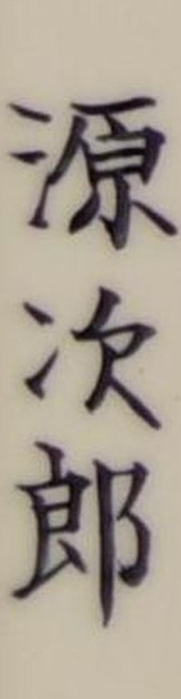源次郎

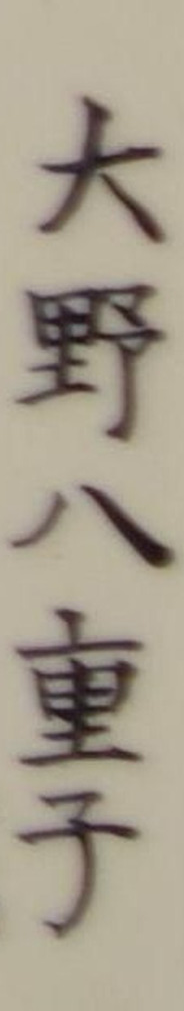大野八重子
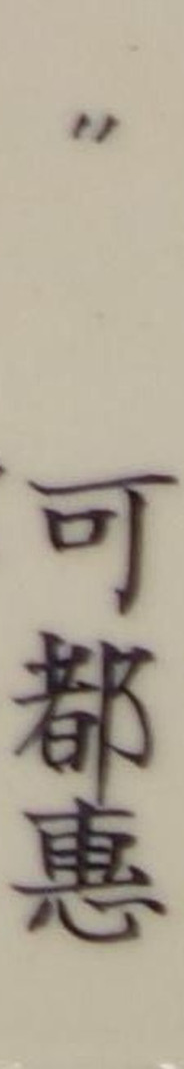可都恵
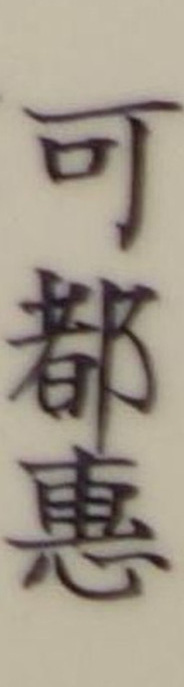可都恵
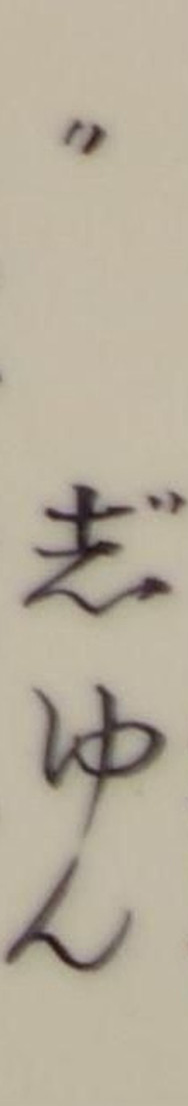じゆん
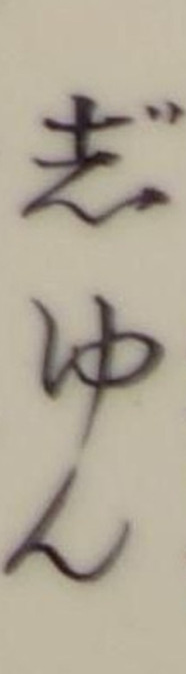じゆん
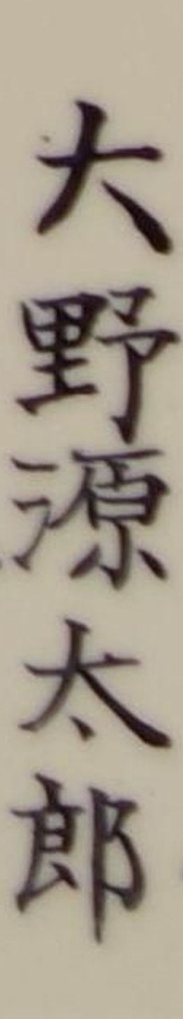大野源太郎
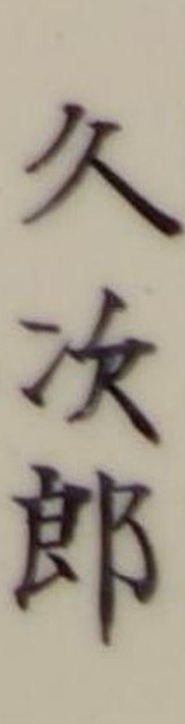久次郎
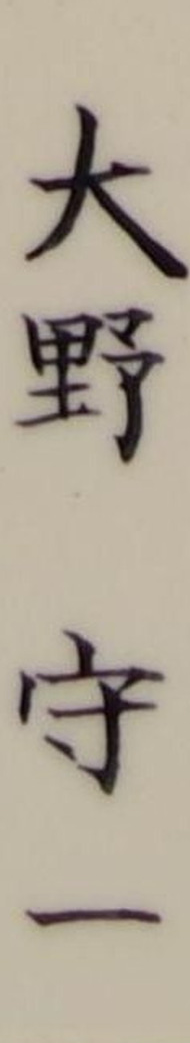大野守一
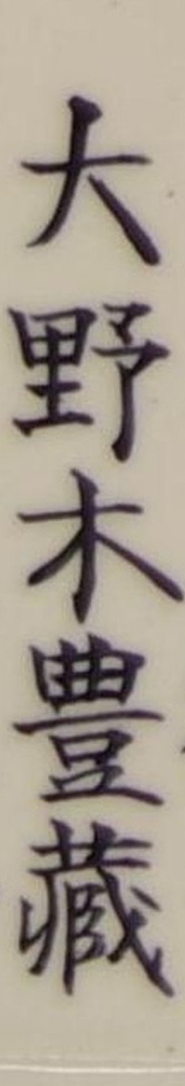大野木豊蔵
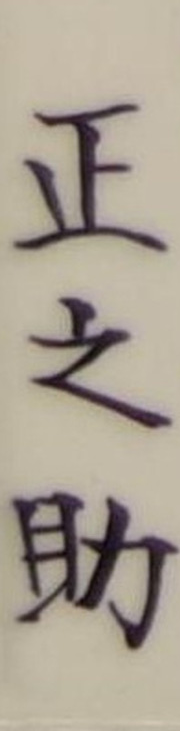正之助

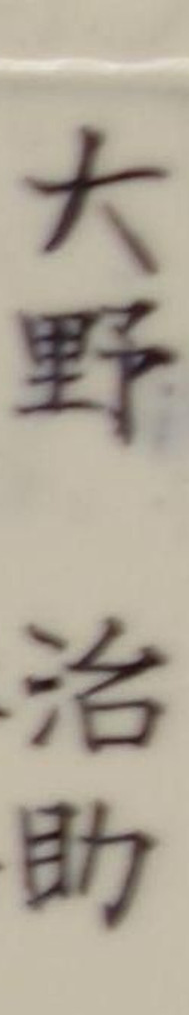大野治助
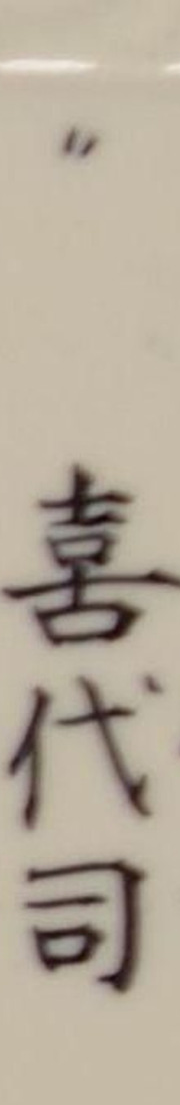喜代司
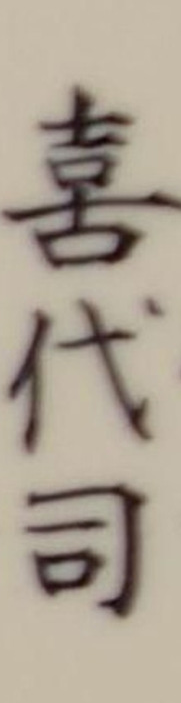喜代司
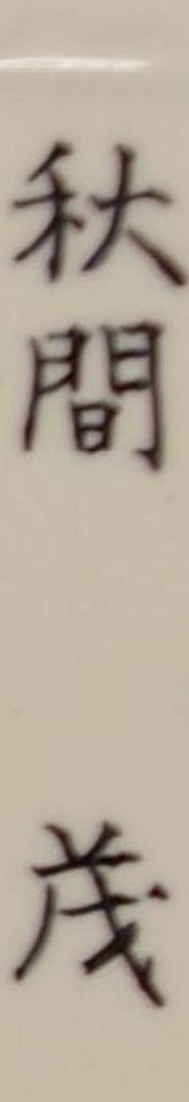秋間茂
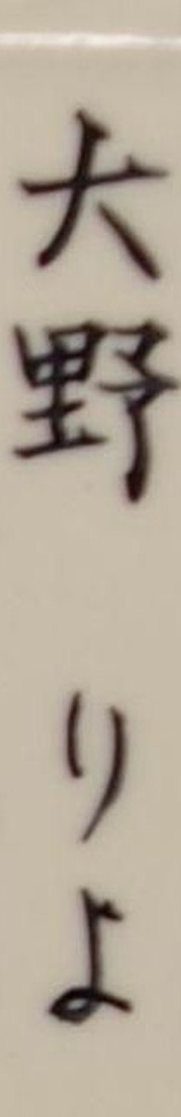大野りよ
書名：M~S
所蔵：高野山金剛峯寺
